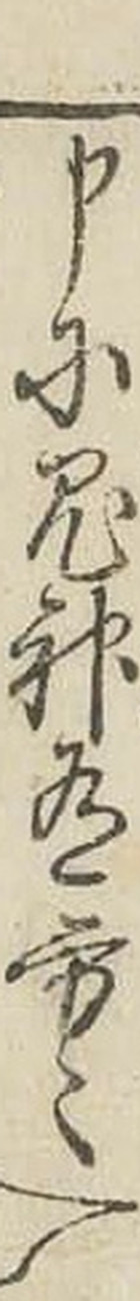申に鬼神有方々
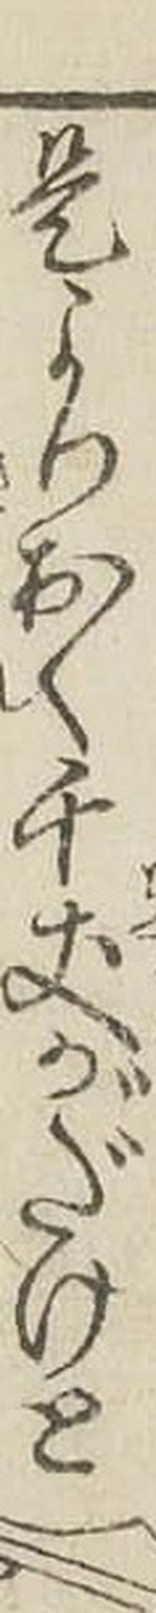是よりおく千丈がだけと
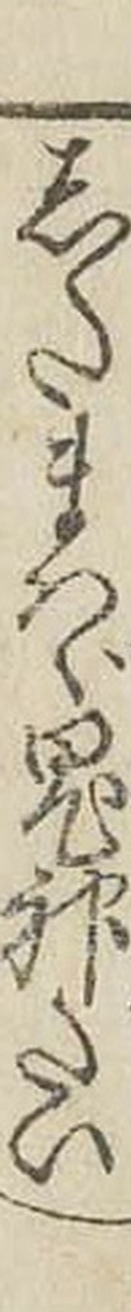したまはゞ鬼神たい
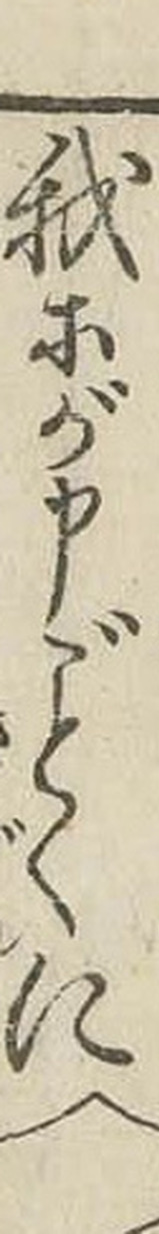我等が申ごとくに
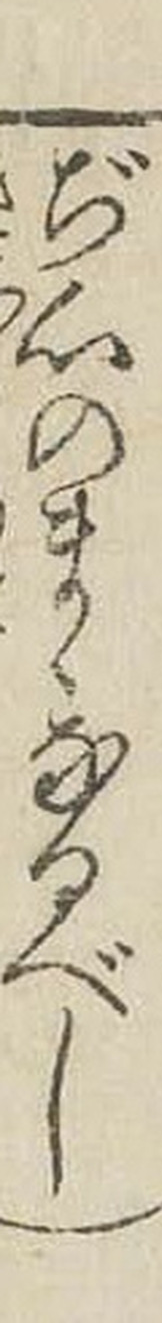ぢ心のまゝなるべし
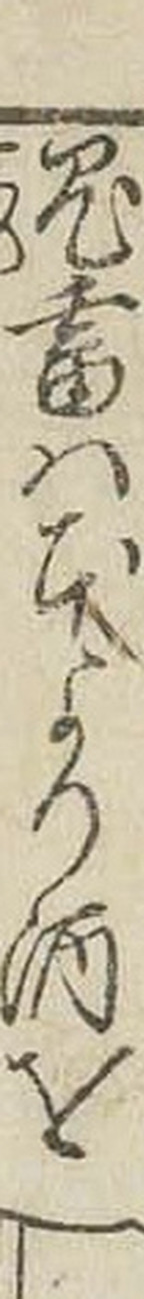鬼畜は本より酒を
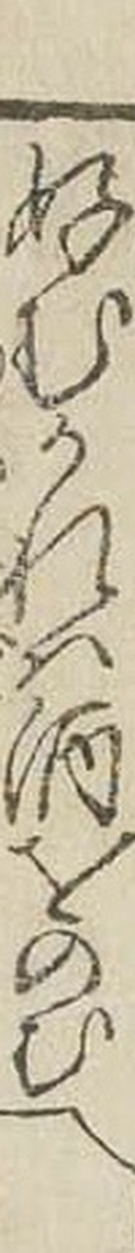好むかれは酒をのむ
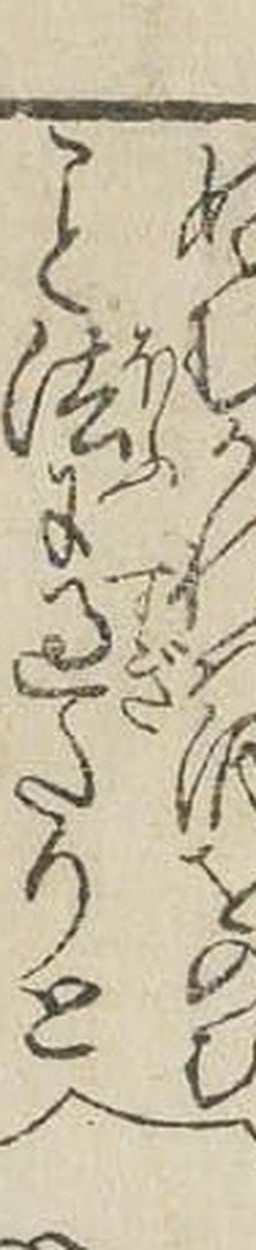こと法に過たりと
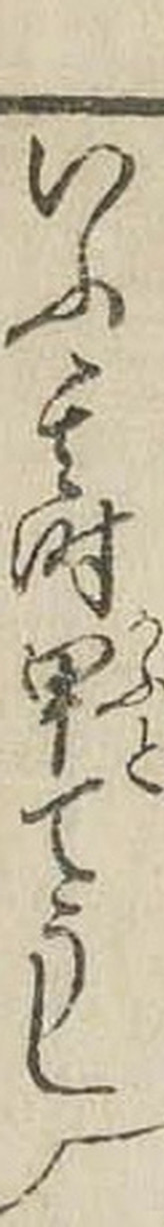いふ其時甲てうし
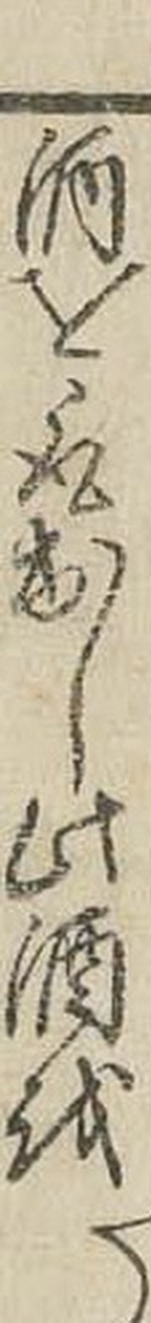酒を取出し此酒を
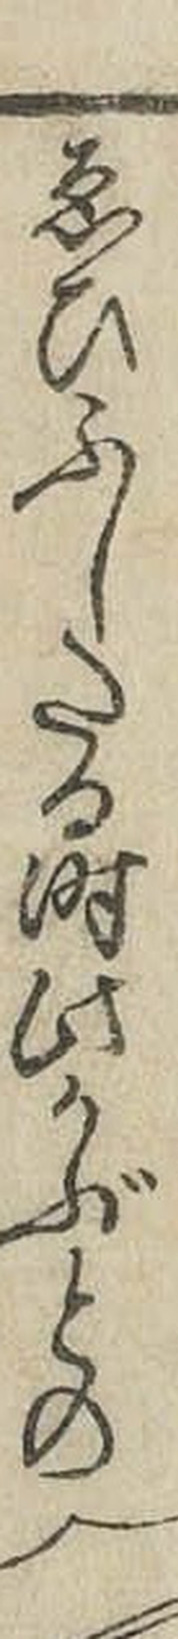ゑひふしたる時此かぶとの
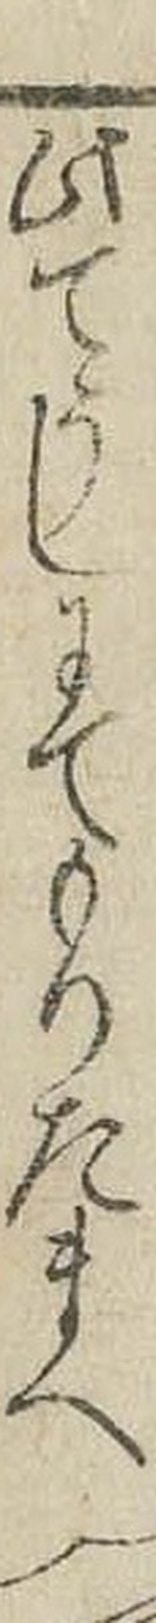此てうしにてもりたまへ
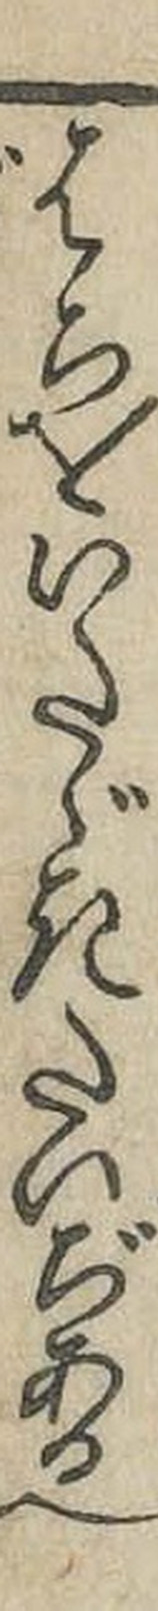はちをいたゞきたいぢある

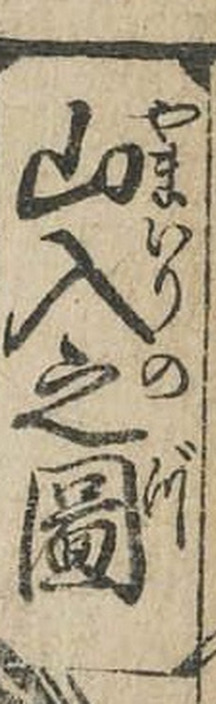山入之図
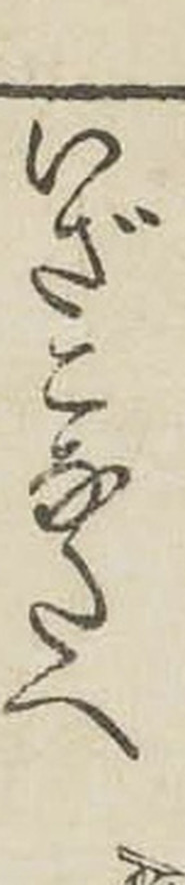いざこなたへ
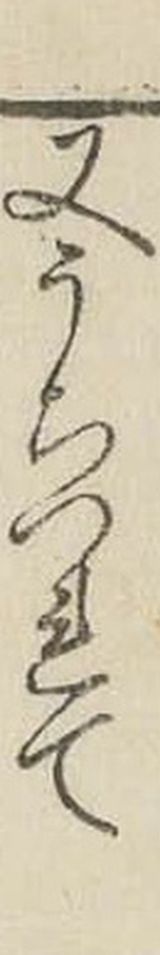又うちつれて
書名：絵本写宝袋 9巻 2之巻
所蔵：東京学芸大学教育コンテンツアーカイブ
